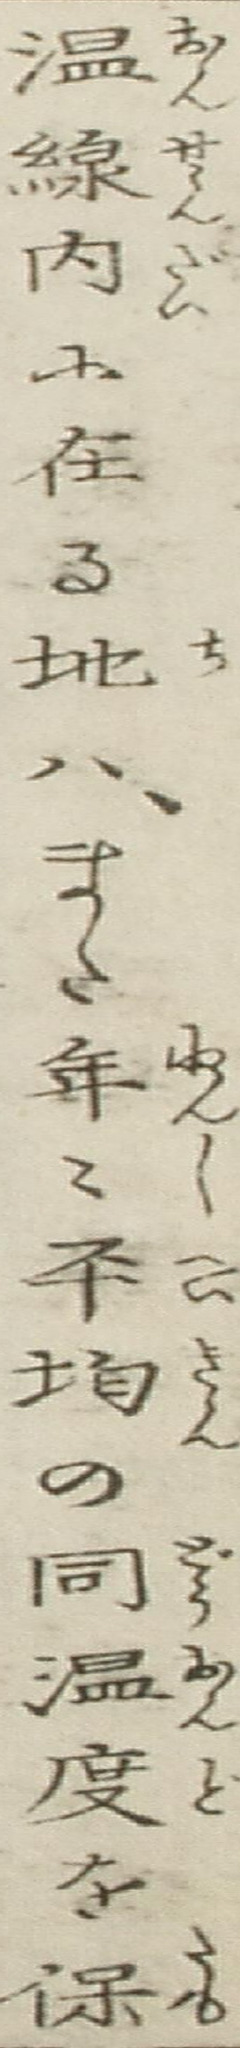温線内に在る地は、また年〻平均の同温度を保
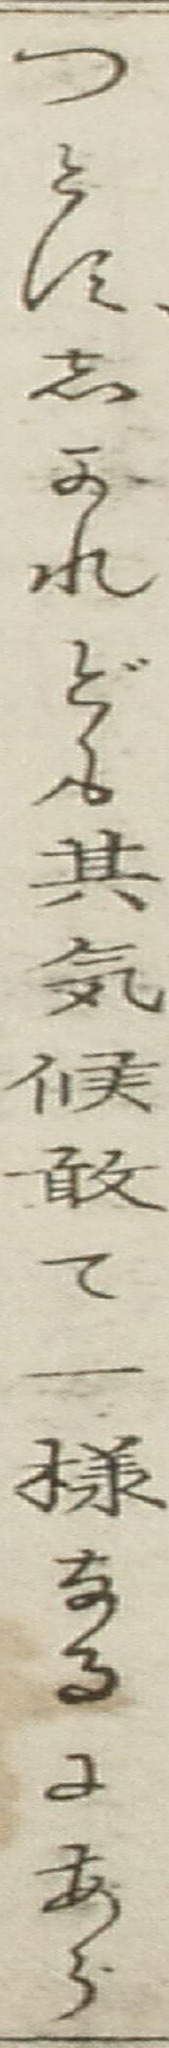つとす、しかれども其気候敢て一様なるにあら
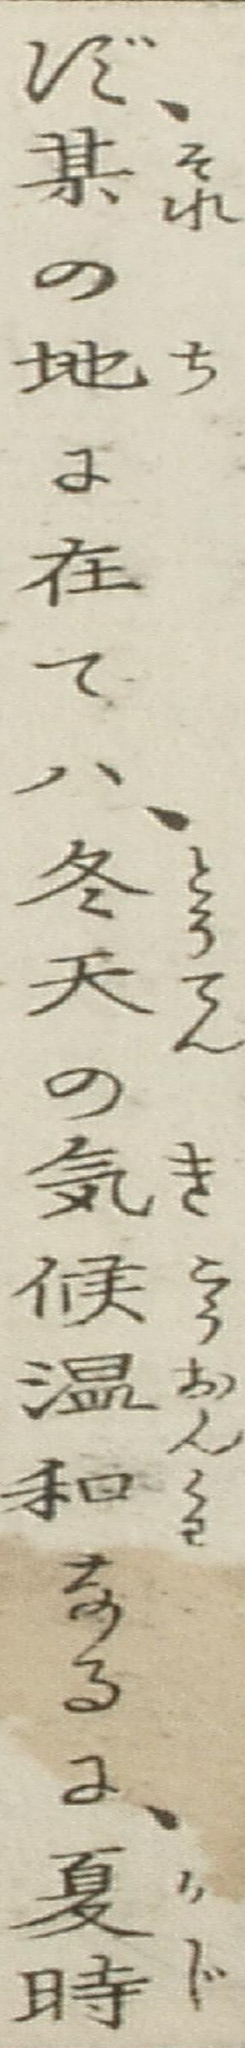ず、某の地に在ては、冬天の気候温和なるに、夏時
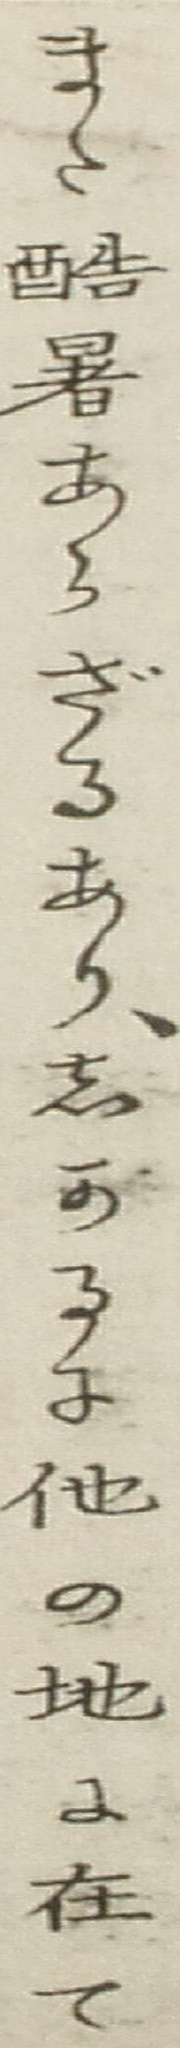また酷暑あらざるあり、しかるに他の地に在て
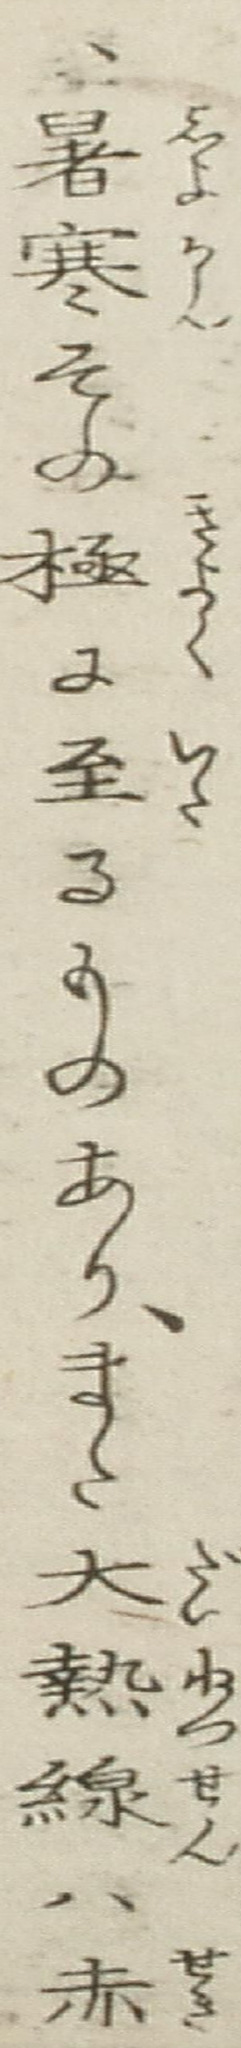、暑寒その極に至るものあり、また大熱線は赤
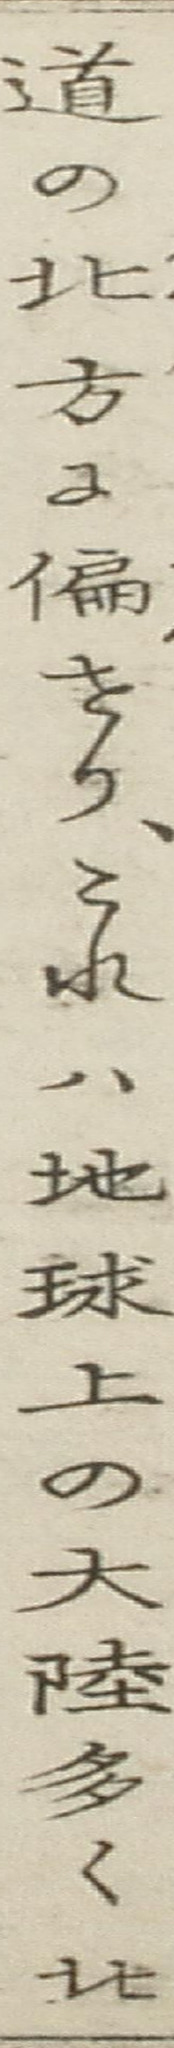道の北方に偏せり、これは地球上の大陸多く北
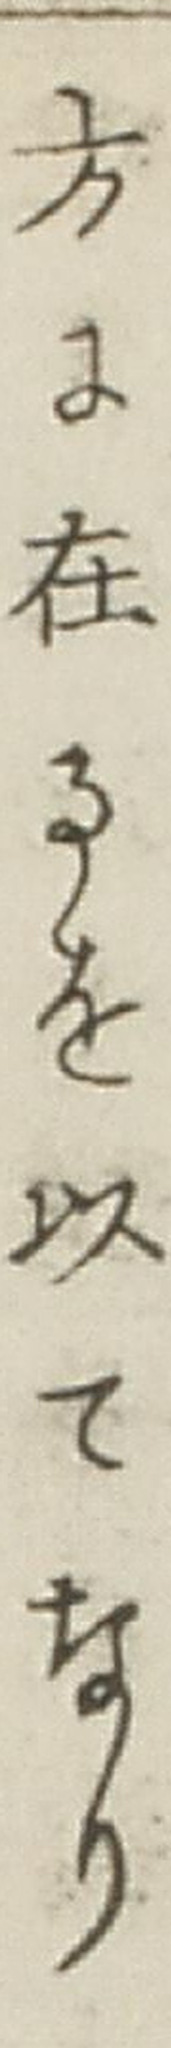方に在るを以てなり
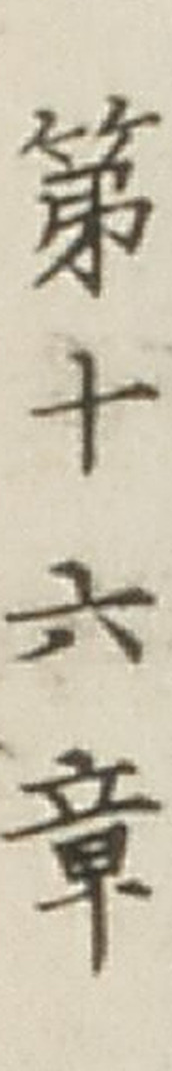第十六章
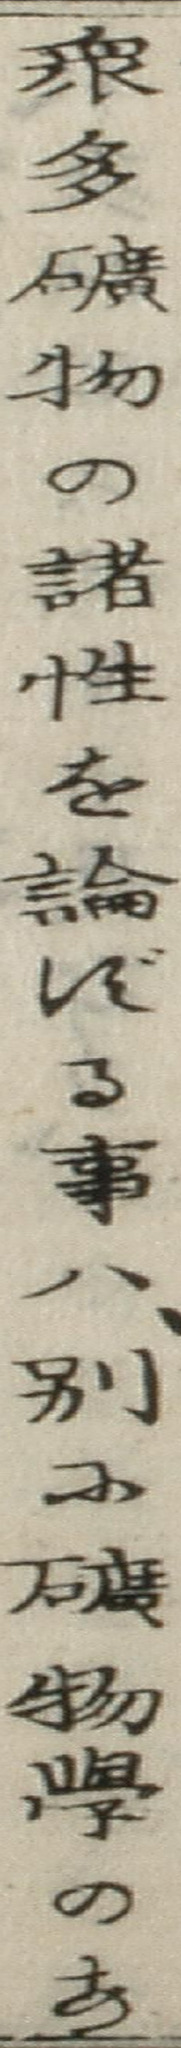衆多礦物の諸性を論ずる事は、別に礦物学のあ
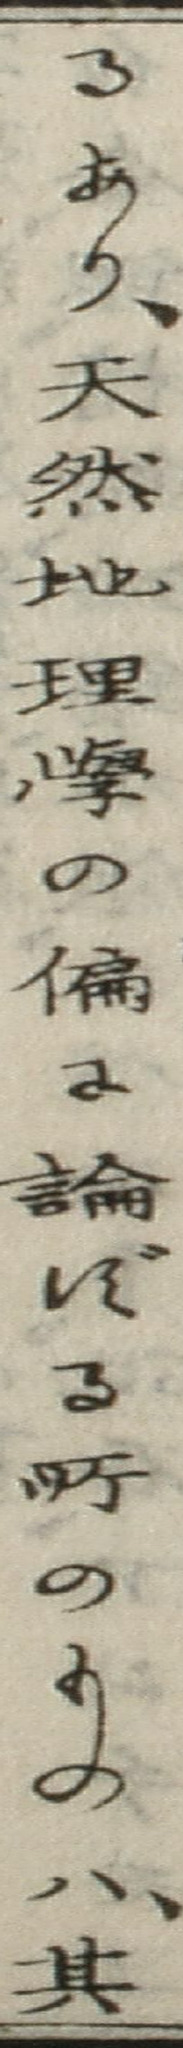るあり、天然地理学の偏に論ずる所のものは、其
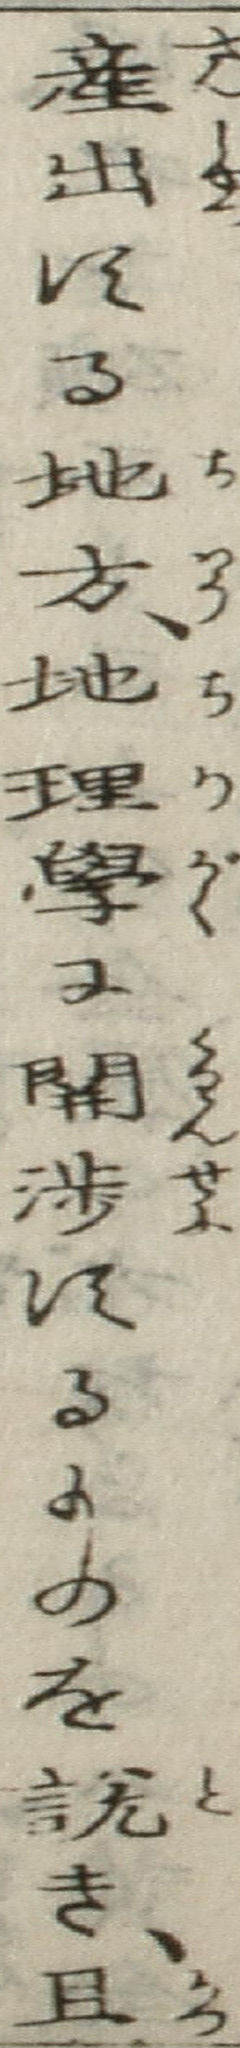産出する地方、地理学に関涉するものを説き、且
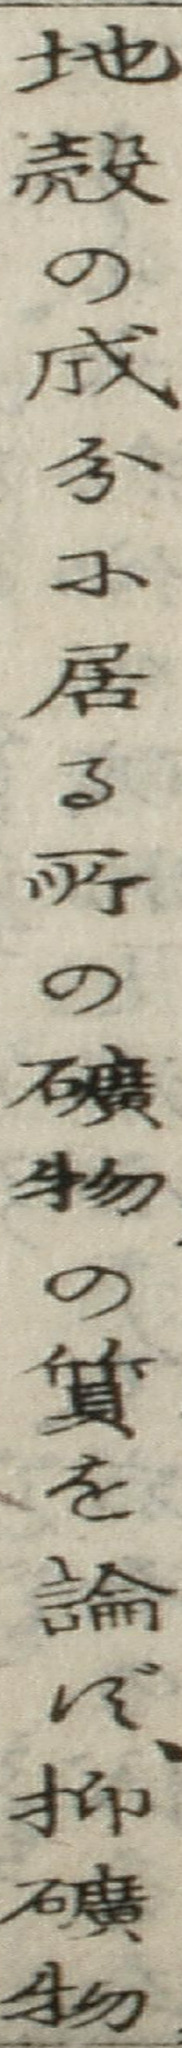地殻の成分に居る所の礦物の質を論ず、抑礦物
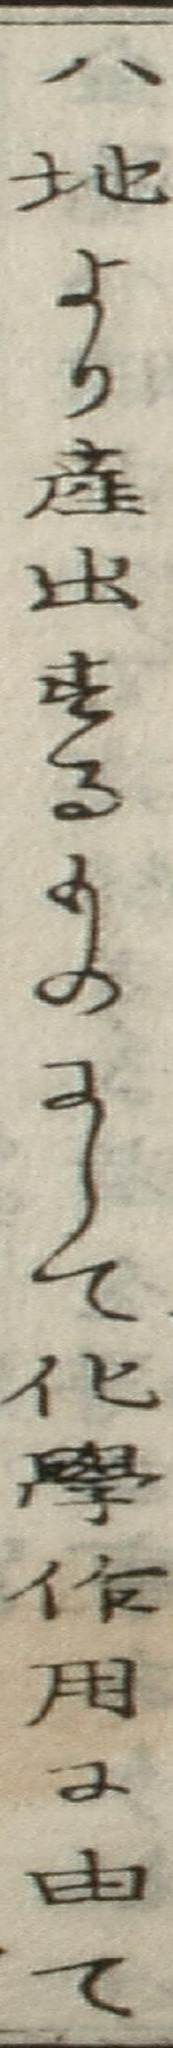は地より産出するものにして、化学作用に由て
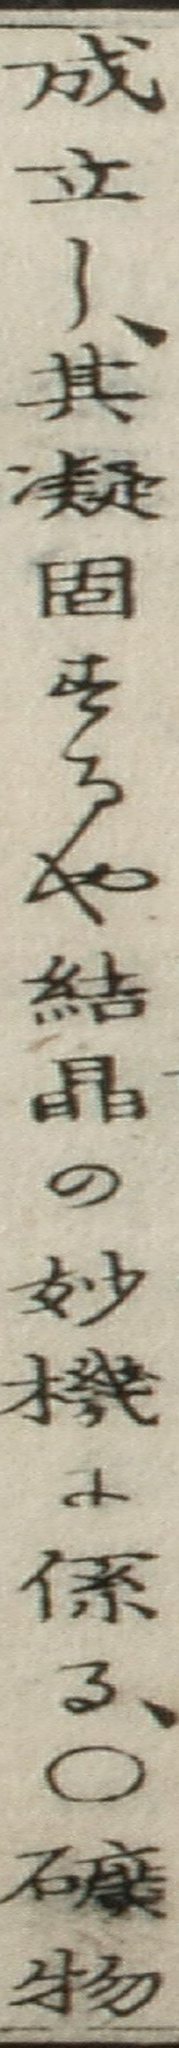成立し、其凝固するや結晶の妙機に係る○礦物
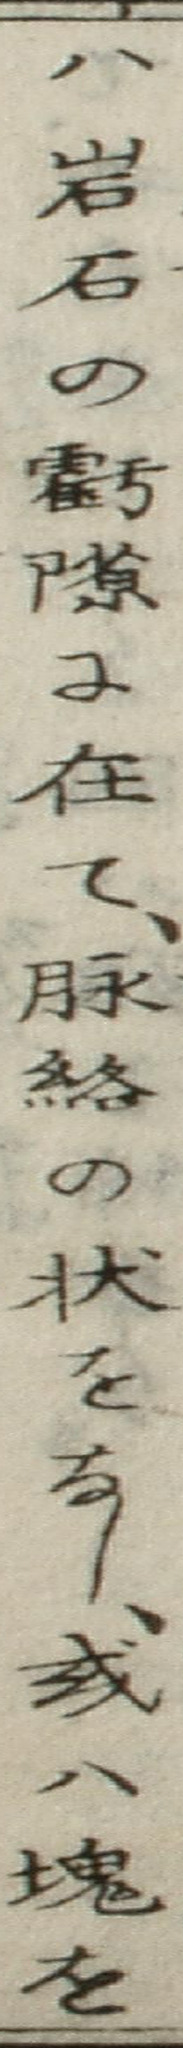は岩石の虧隙に在て、脈絡の状をなし、或は塊を
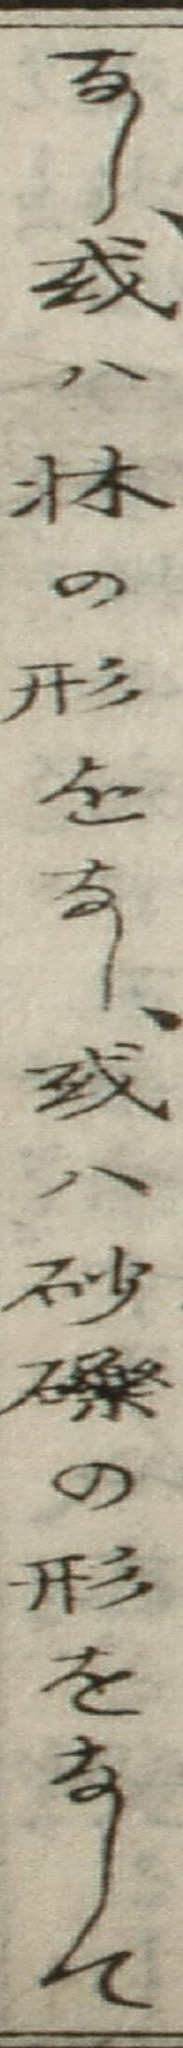なし、或は床の形をなし、或は砂礫の形をなして
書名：訓蒙　天然地理學　下
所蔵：東京大学地震研究所図書室 Earthquake Research Institute Library, The University of Tokyo, JAPAN
